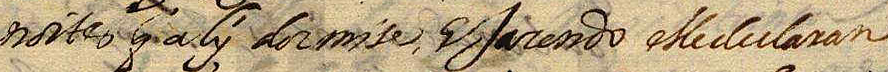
noites que aly dormise, e jazendo elle declaran
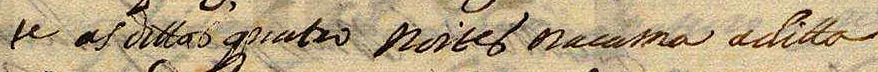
te as dittas quatro noites na cama a ditta
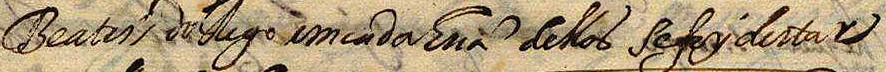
Beatris do Rego em cada huā dellas se foy deitar
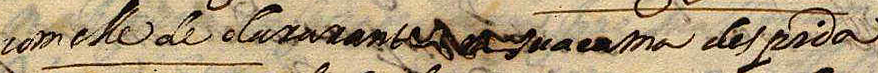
com elle declarante em sua cama despida
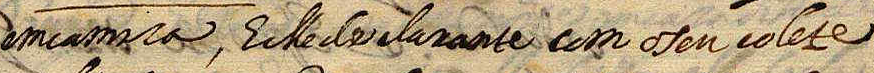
em camiza, e elle declarante com o seu colete
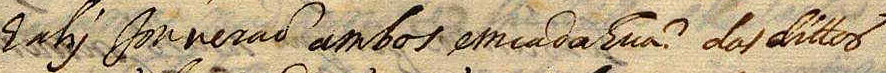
e aly jouveraõ ambos em cada huā das dittas
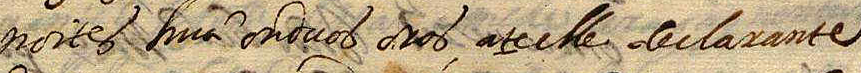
noites huā ou duas oras até elle declarante
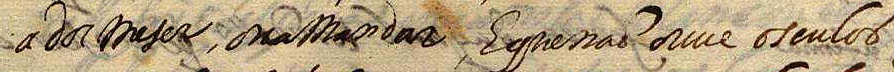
adormeser, ou a mandar, e que naõ ouve osculos
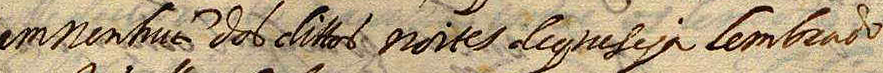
em nenhuā das dittas noites de que seja lembrado
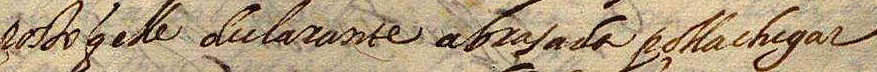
posto q̄ elle declarante abrasada polla chegar
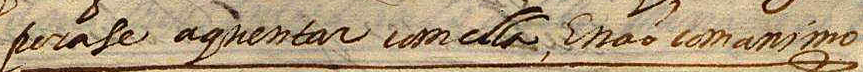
pera se aquentar com ella, E naõ com animo
